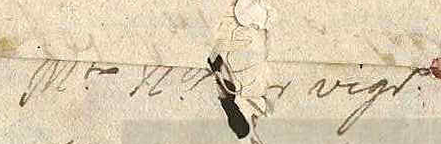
M.to ____ vigar.o
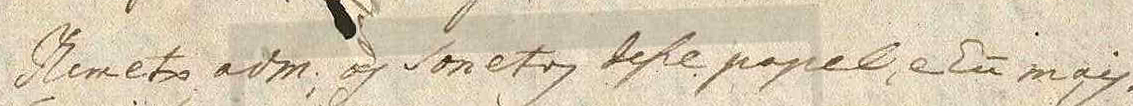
Remeto a v m. os Sonetos desse papel, e hū mais
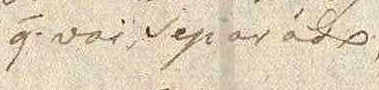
q̄ vai separado
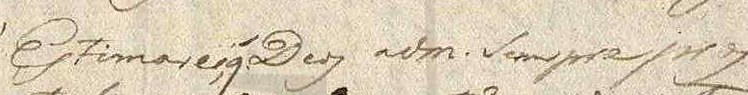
Estimarei q̄ Deos a vm. sempre pros
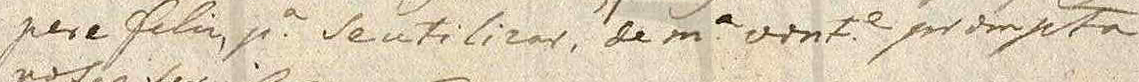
pere feliz p.a se utilizar, de m.a vont.e prompta
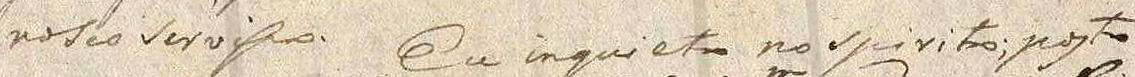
no seo servisso. Eu inquieto no spirito; posto
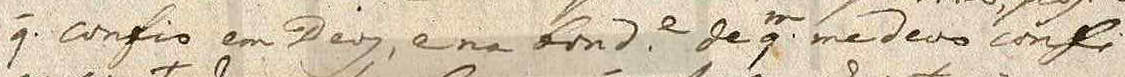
q̄ confio em Deos, e na bond.e q.m me devo confi
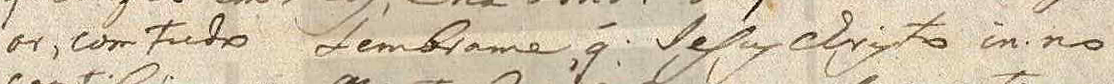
ar, comtudo Lembrame, q̄ Iesus christo in. no
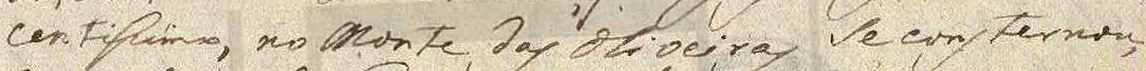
centissimo, no monte das Oliveiras se consternou;
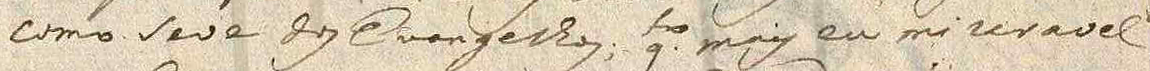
como se ve dos Evangelhos; q.to mais eu mizeravel
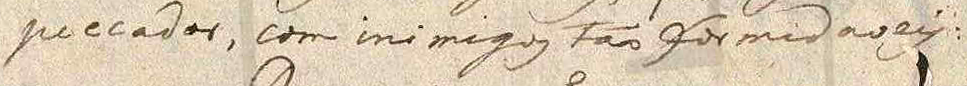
peccador, com inimigos taõ formidaveis.
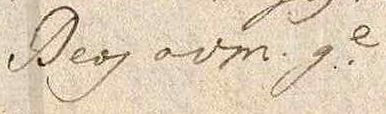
Deos a v m. g.e
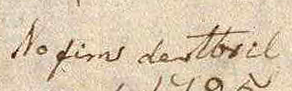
No fim de Abril
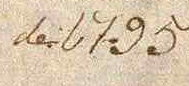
de 1799
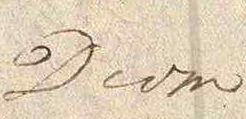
De vm
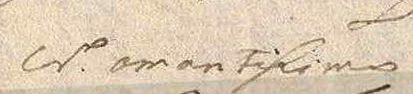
cr.o amantissimo
